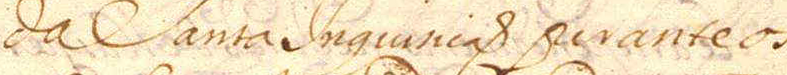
da Santa Inquisicaõ perante os
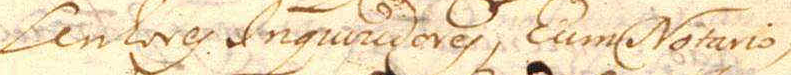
Senhores Inquizidores, hum Notario,
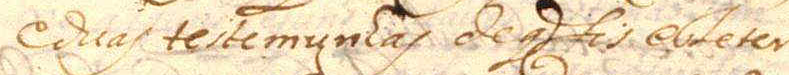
e duas testemunhas de q̄ fis este ter
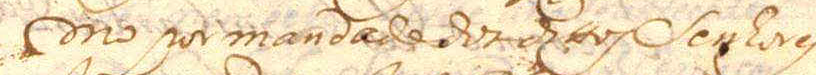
mo por mandado dos dittos Senhores
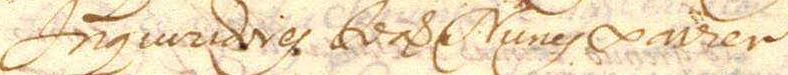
Jnquizidores Ioaõ Nunes xavier
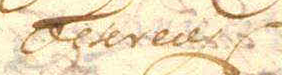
o escreuj
